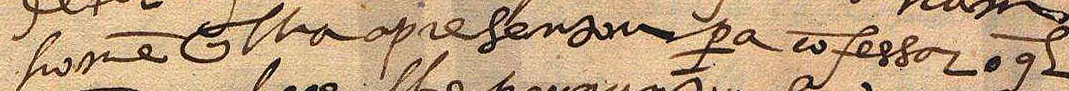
homē q̄ lha apresentou ꝑa cōfessar o q̄l
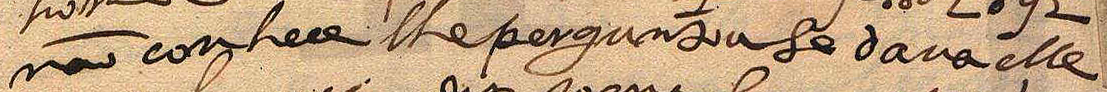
não conhece lhe perguntou se daua elle
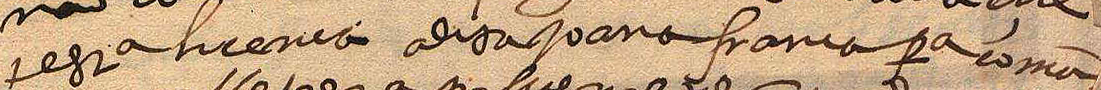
testa licença a dita Joana franca ꝑa cōmū
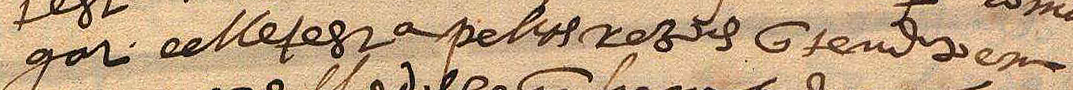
gar e elle testa pellas rezois q̄ ten dito em
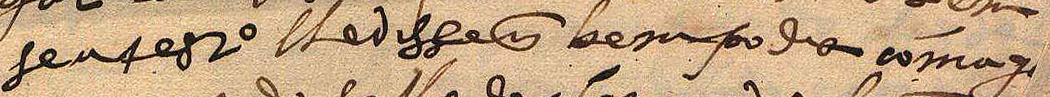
seu testo lhe disse q̄ bem pode cōmug
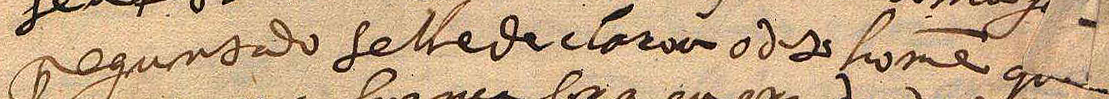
preguntado se lhe declarou o dito homē que
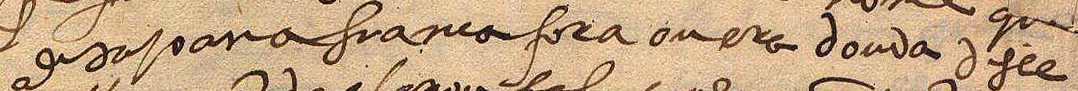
a dita joana franca fora ou era douda disse
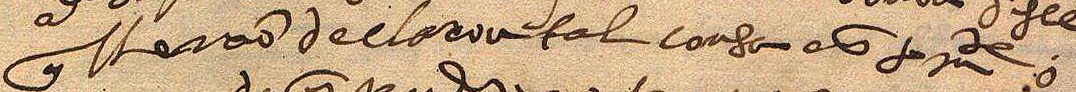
q̄ lhe naõ declarou tal cousa e q̄ somte o
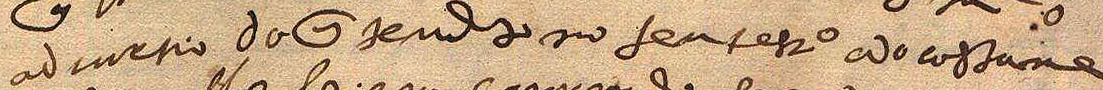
aduirtio do q̄ ten dito no seu testo e do costume
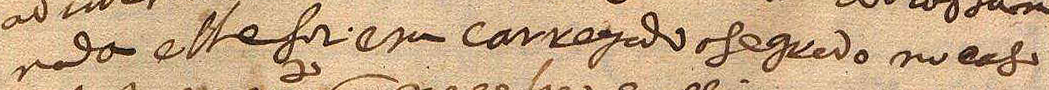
nada e lhe foi emcarregado o segredo no caso
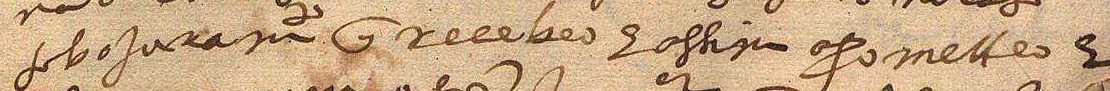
sob o Juramto q̄ reçebeo e assim o ꝓometteo E
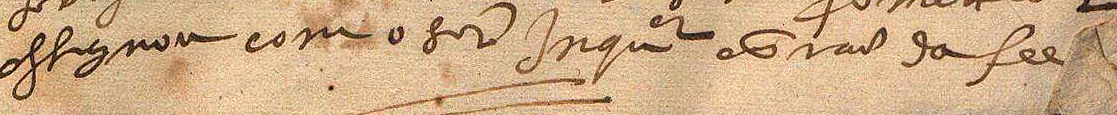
assignou com o sor̄ Jnquor e q̄ naõ da fee
